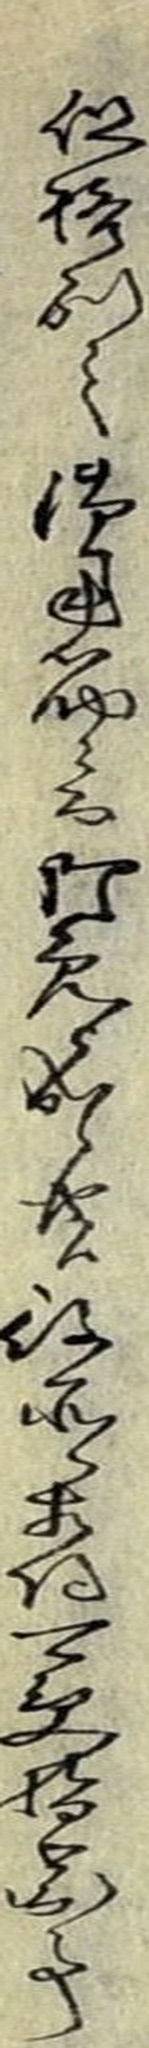但格別之御用筋ニ而御免被成候儀ハ役所へ相伺可受指図事
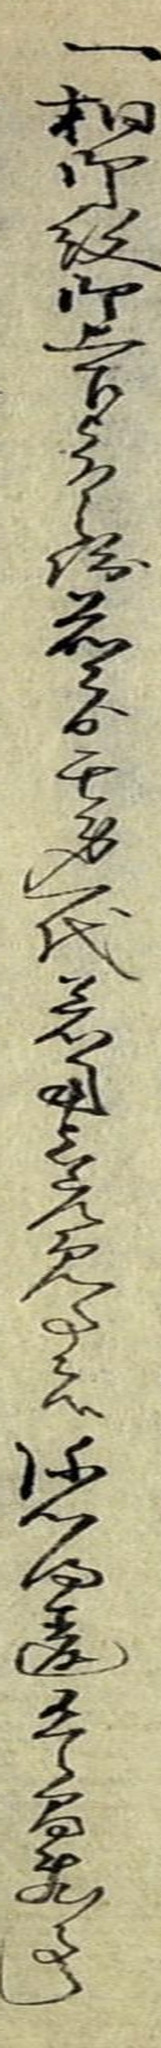一桐御門御上下被下之儀前々ゟ其身一代着用被差免事ニ候弥心得違有之間敷事
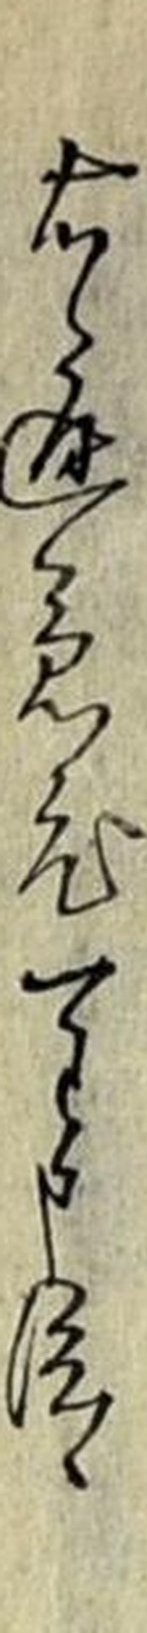右之通急度可被申渡候
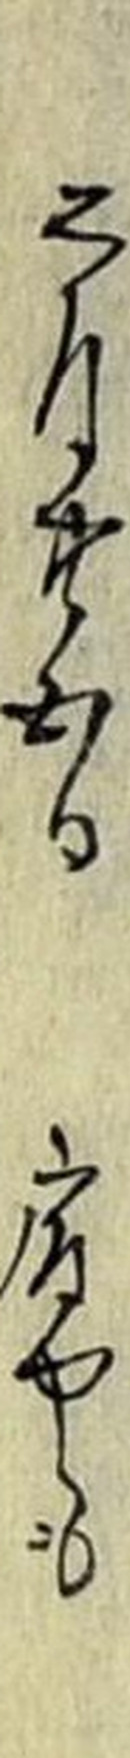二月廿五日府中へも
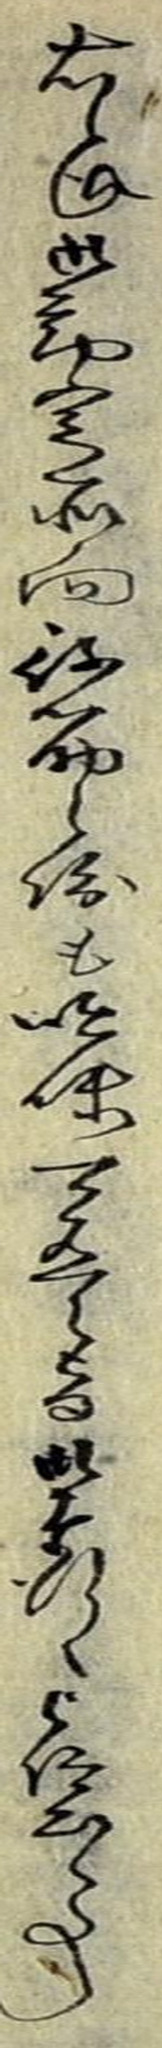右之趣御勘定所向役筋之儀も吟味可有之旨御奉行へ被仰出事
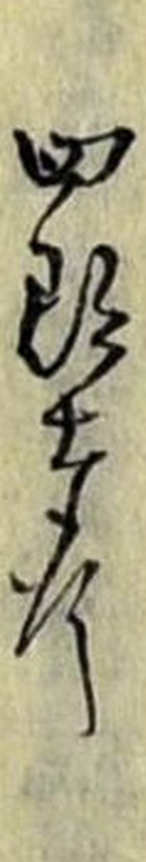四郡奉行
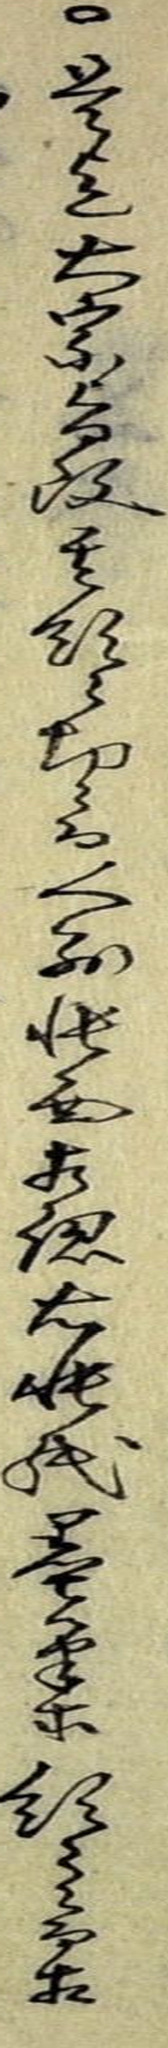〇是迄大宗旨改其領々切ニ而人別帳面相認右帳紙墨筆等領々ニ而相
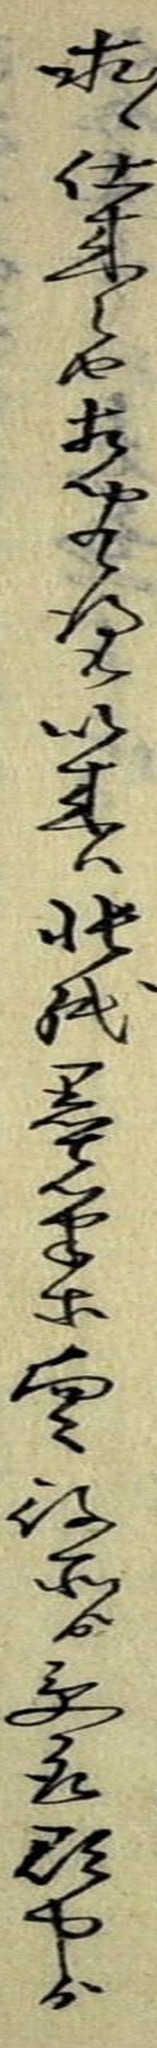求候仕来之由相聞候得共以来ハ帳紙墨筆等向々役所ゟ受取郡中ゟ
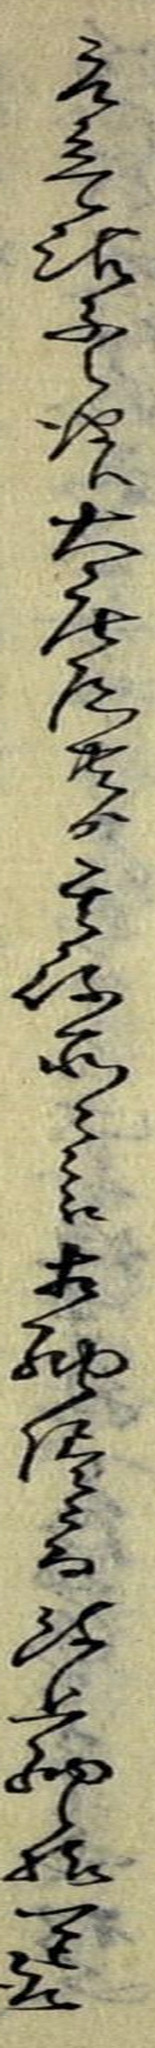取立候銀子之儀ハ大庄屋共ゟ其役所々々江相納候儘ニ而致上納候様可被取
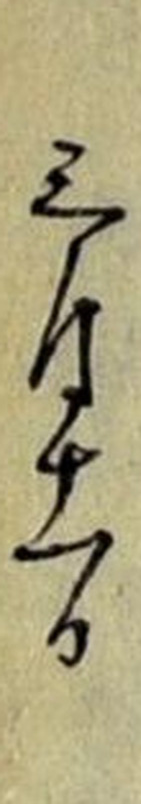三月十一日
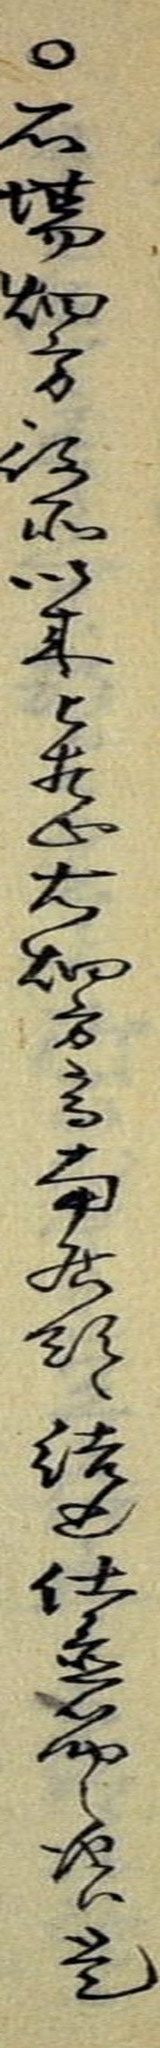〇石場畑方役所以来被相止右畑方ニ而南居領へ詰込仕置筋之儀ハ是
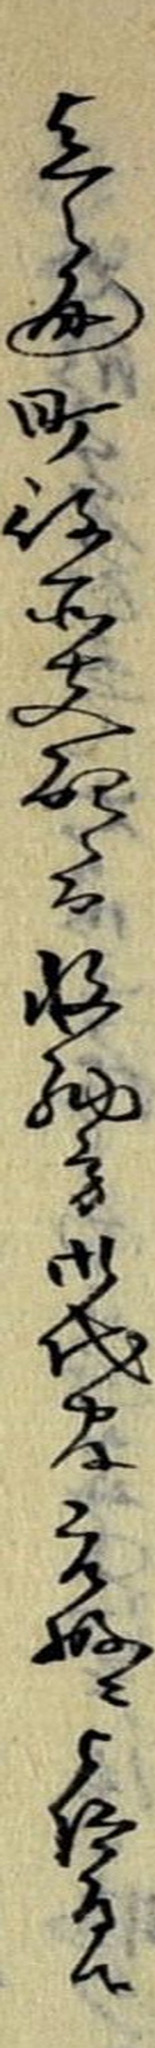迄之通町役所支配ニ而収納方御代官取扱ニ被仰付候
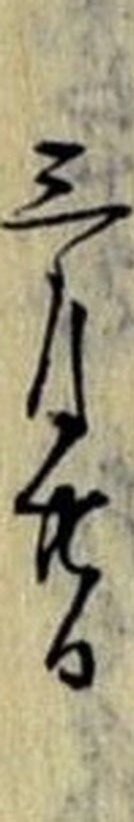三月廿日
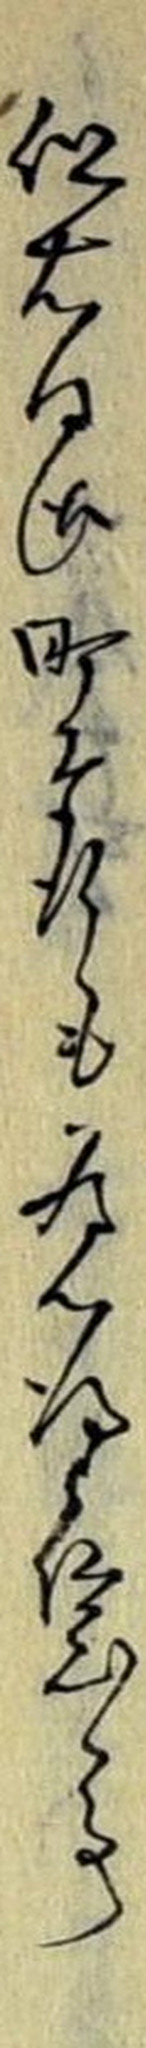但右同趣町奉行へも為心得被仰出候事
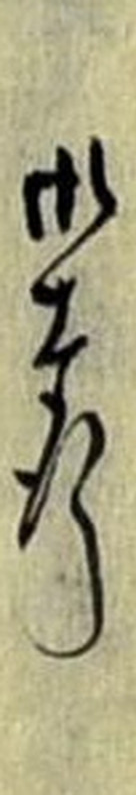御奉行
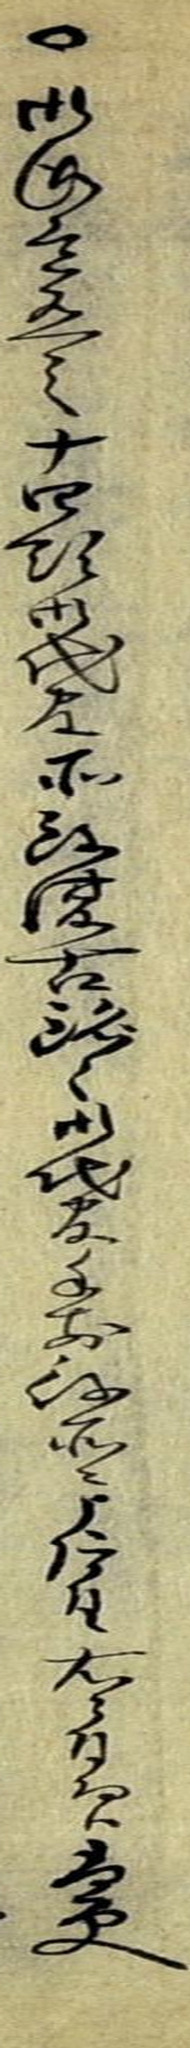〇御趣意有之十四領御代官所致復古銘々御代官手前役所ニ被仰付候右ニ付而ハ尚更
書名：命令之部 五
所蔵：福井県文書館 Fukui Prefectural Archives
